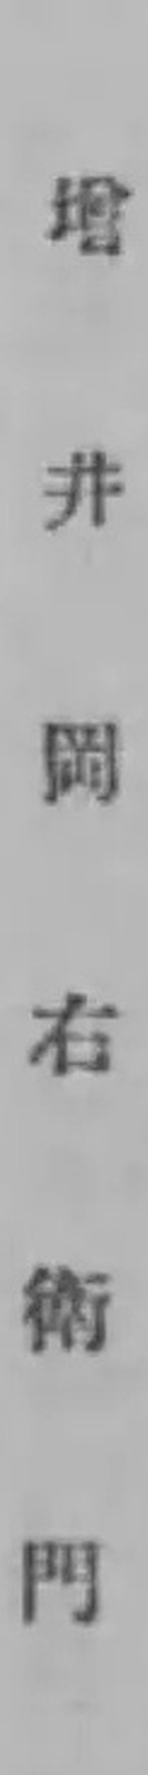増井岡右衛門
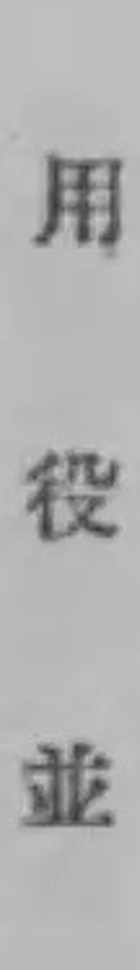用役並
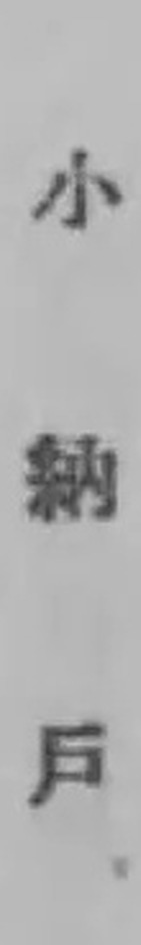小納戸
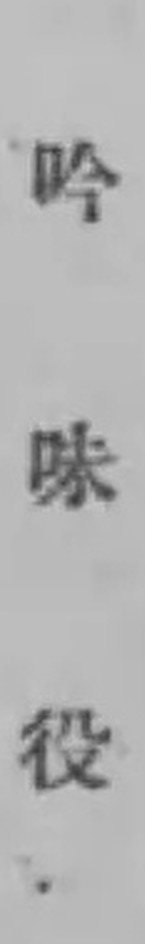吟味役
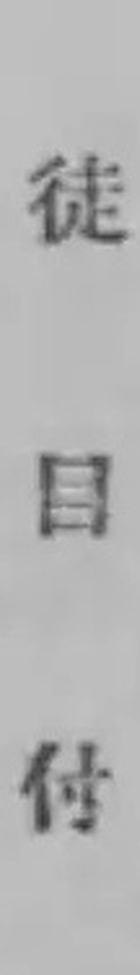徒目付
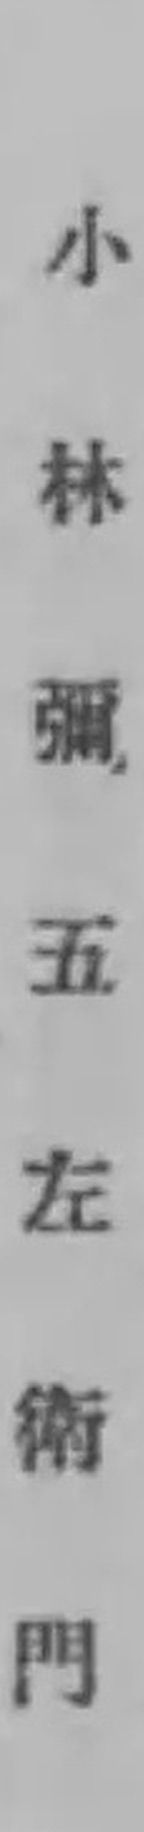小林彌五左衛門
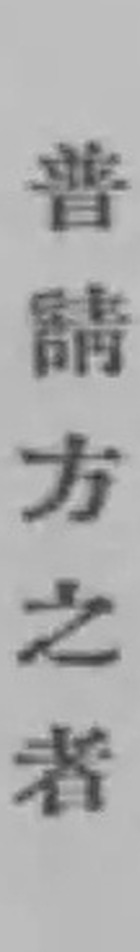普請方之者
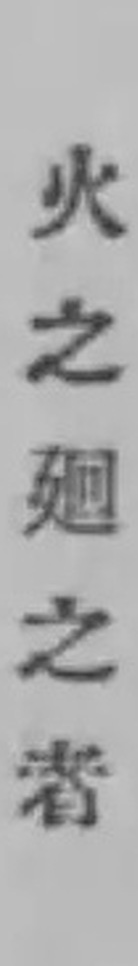火之廻之者
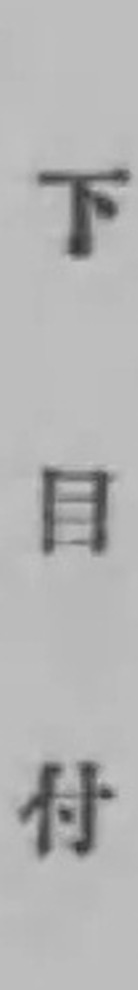下目付
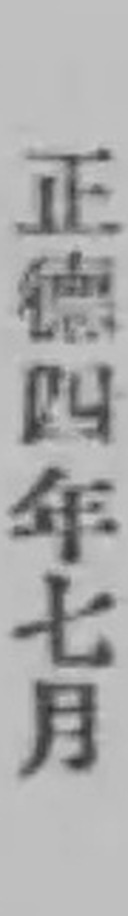正徳四年七月日
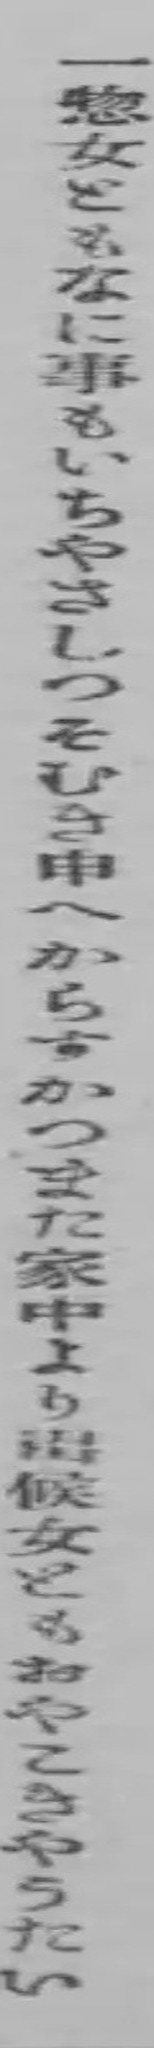一惣女ともなに事もいちやさしつそむき申へからすかつまた家中より出候女ともおやこきやうたい
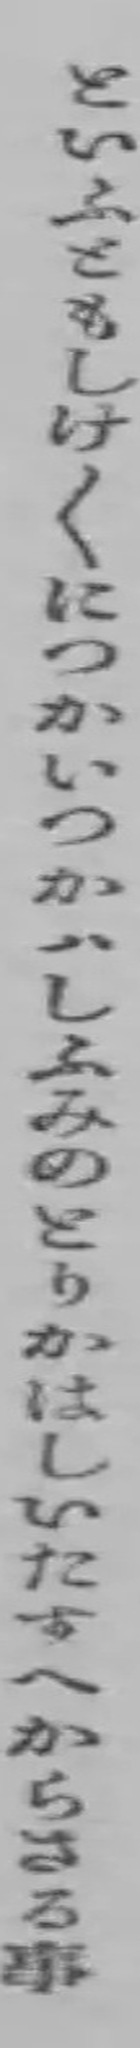といふともしけ〳〵につかいつかはしふみのとりかはしいたすへからさる事
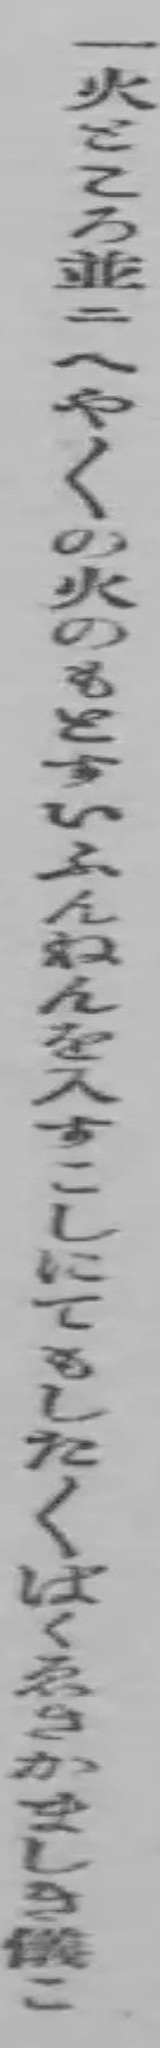一火ところ並ニへや〳〵の火のもとすいふんねんを入すこしにてもした〳〵ばくゑさかましき儀こ
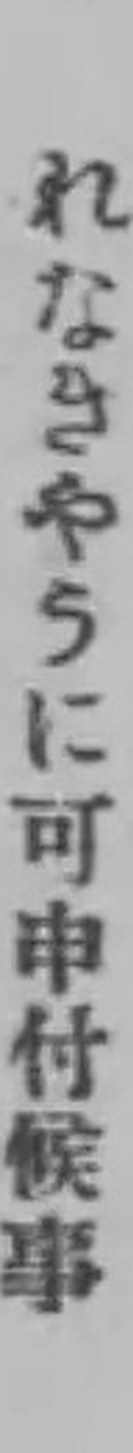れなきやうに可申付候事
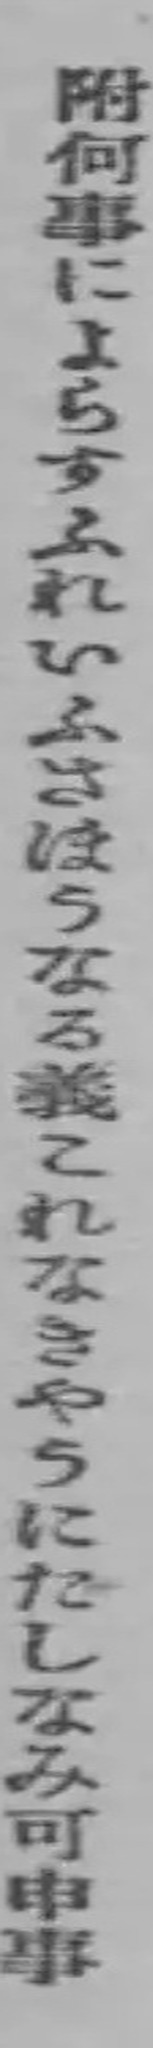附何事によらすふれいふさほうなる義これなきやうにたしなみ可申事

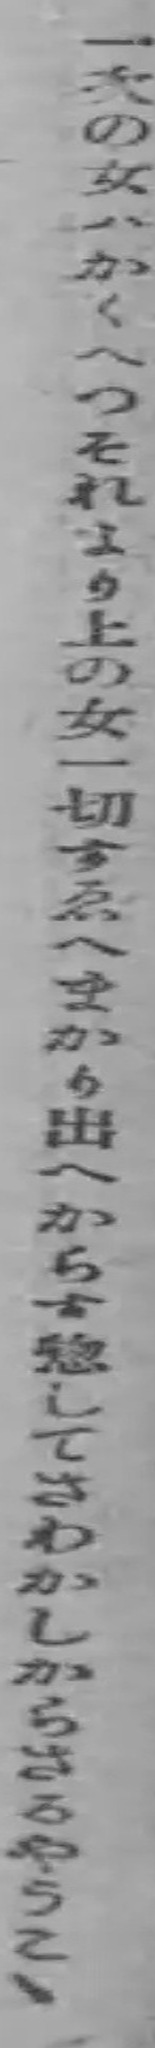一次の女はかくへつそれより上の女一切すゑへまかり出へからす惣してさわかしからさるやうこゝ
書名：豊橋市史談
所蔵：国立国会図書館 National Diet Library, JAPAN
